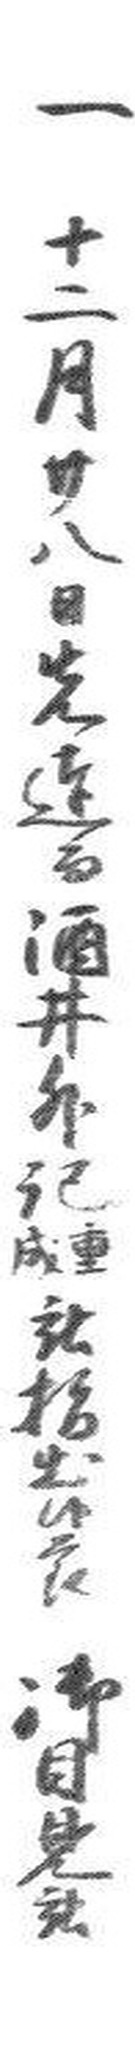一十二月廿八日先達而酒井外記重成被指出候節御目見被
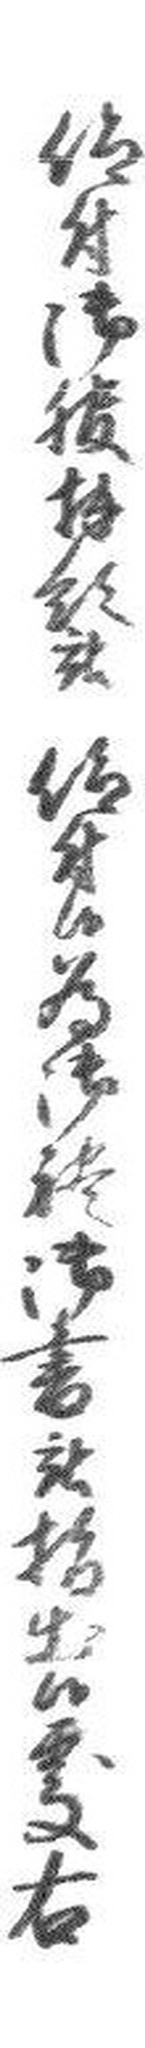仰付御服拝領被仰付候為御礼御書被指出候処右
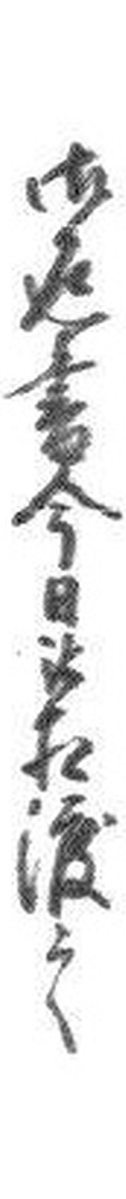御返書今日被相渡之
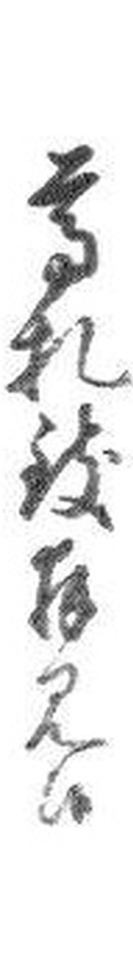尊札致拝見候
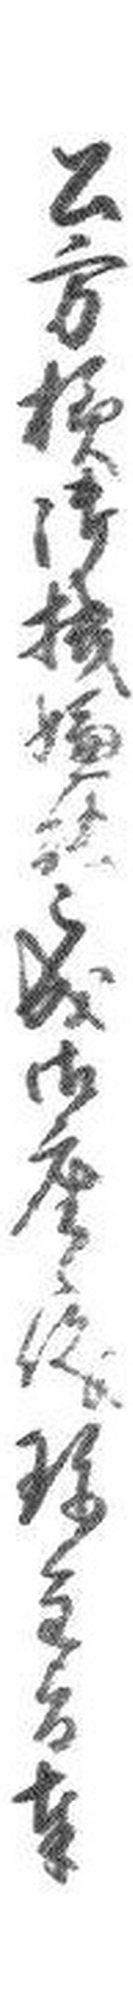公方様御機嫌能被成御座候儀珎重旨奉
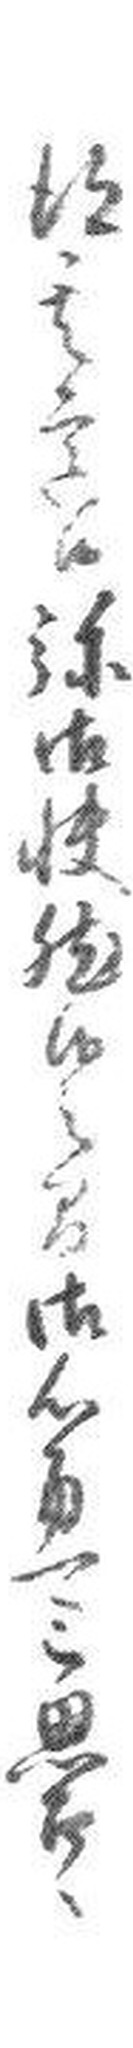得其意候弥御快然候之間御心易可被思召候
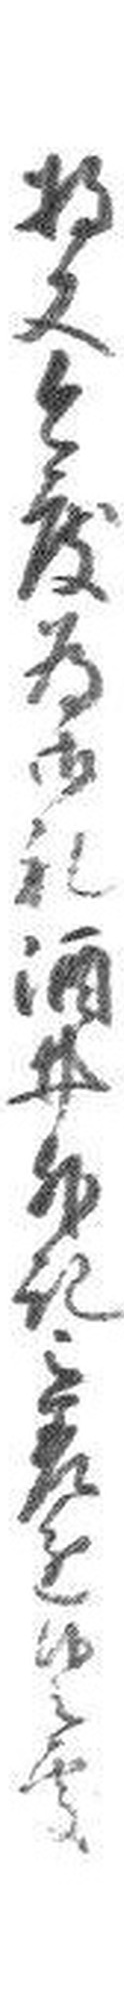将又今度為御礼酒井外記被差進候之処
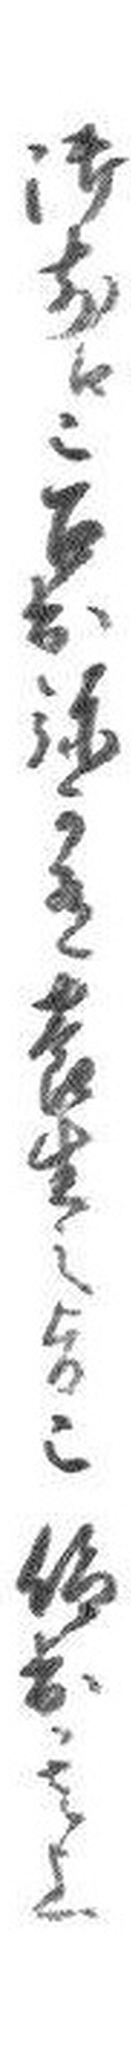御前江被召出弥可有養生之旨被仰出其上
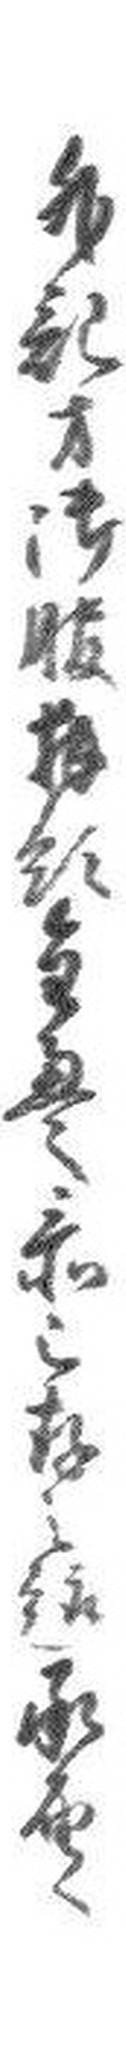外記方御服拝領重畳忝被存之趣承届候

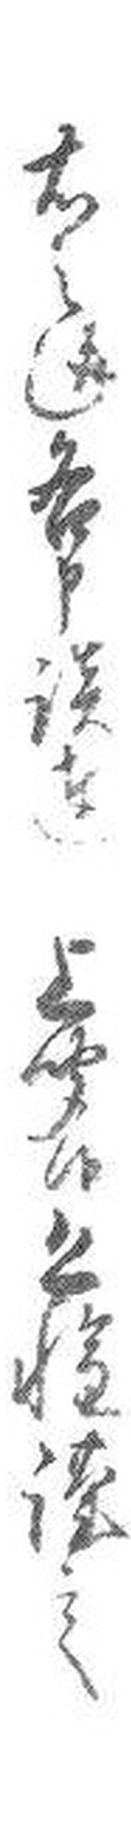右之趣各申談達上聞候恐惶謹言
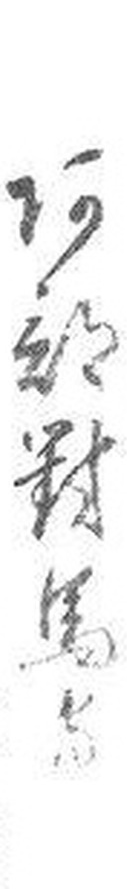阿部対馬守
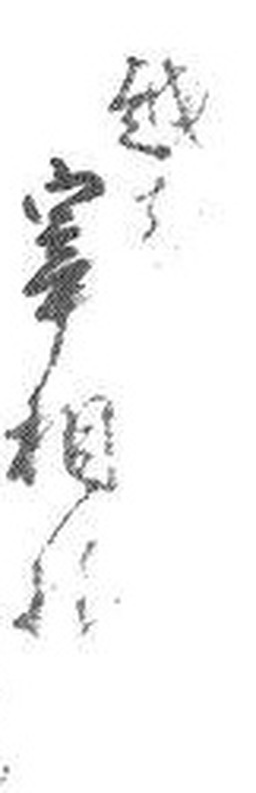宰相様
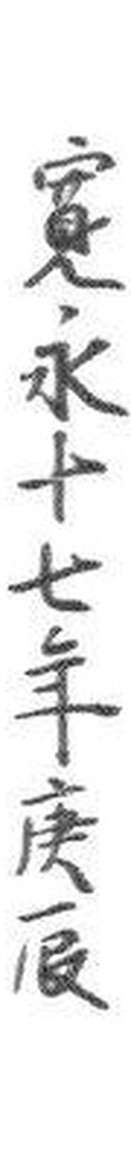寛永十七年庚辰
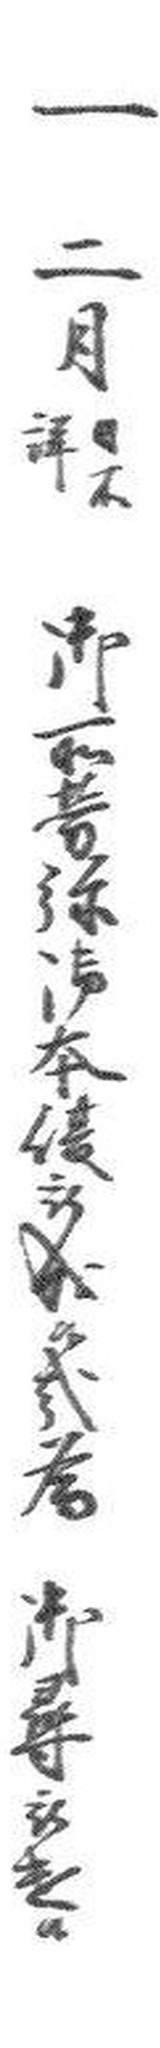一二月日不詳御所労弥御本復被成候哉為御尋被遣候
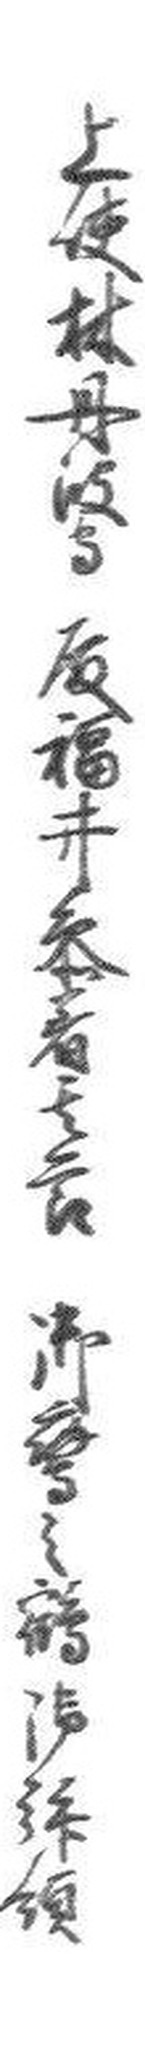上使林丹波守殿福井参着其節御鷹之鶴御拝領
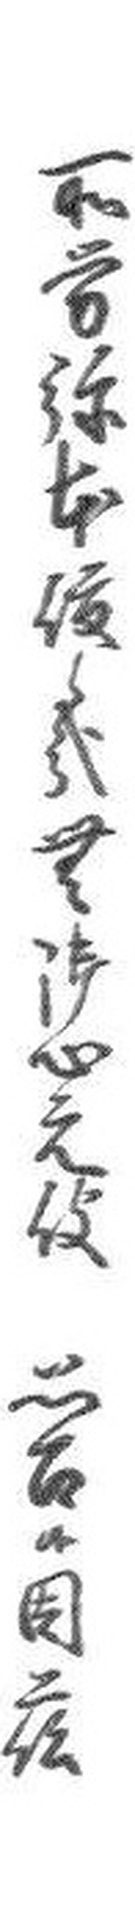所労弥本復候哉無御心元被思召候因茲
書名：家譜 四 忠昌公 従寛永七年到正保四年
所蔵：福井県文書館 Fukui Prefectural Archives
